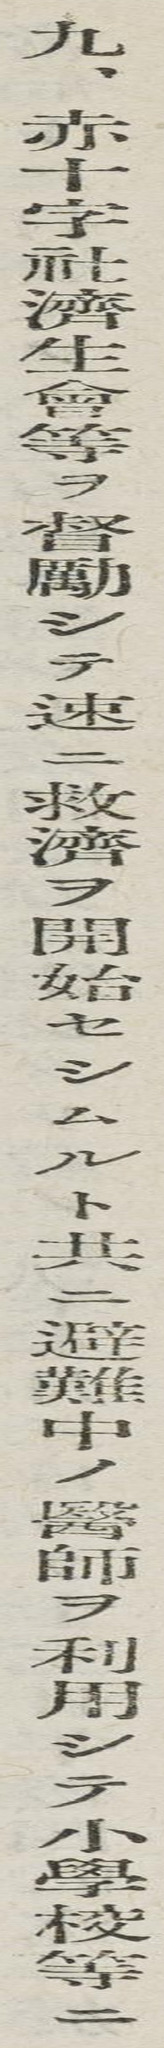九、赤十字社救生会等ヲ督励シテ速ニ救済ヲ開始セシムルト共ニ避難中ノ医師ヲ利用シテ小学校等ニ
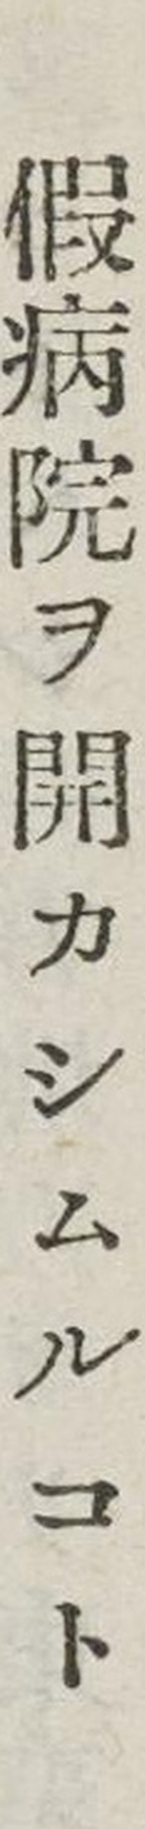仮病院ヲ開カシムルコト
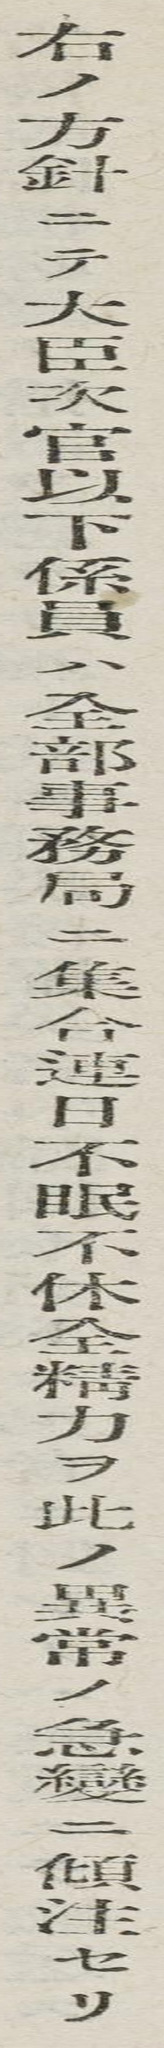右ノ方針ニテ大臣次官以下係員ハ全部事務局ニ集合連日不眠不休全精力ヲ此ノ異常ノ急変ニ傾注セリ
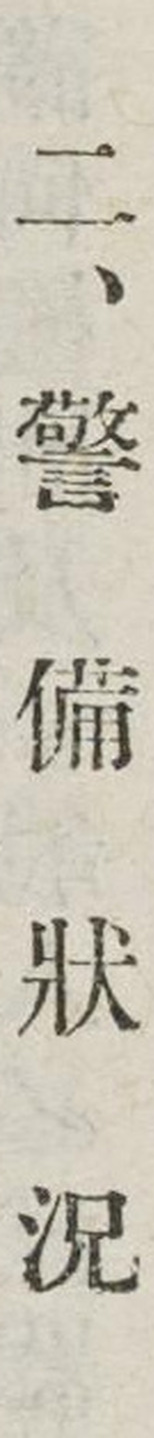二、警備状況
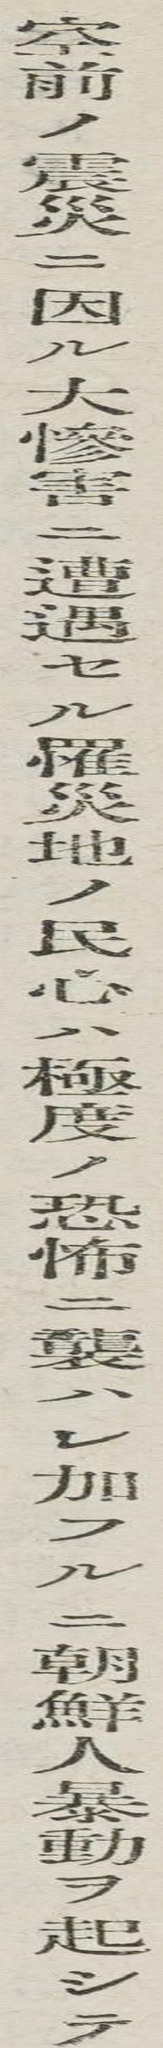空前ノ震災ニ因ル大惨害ニ遭遇セル罹災地ノ民心ハ極度ノ恐怖ニ襲ハレ加フルニ朝鮮人暴動ヲ起シテ
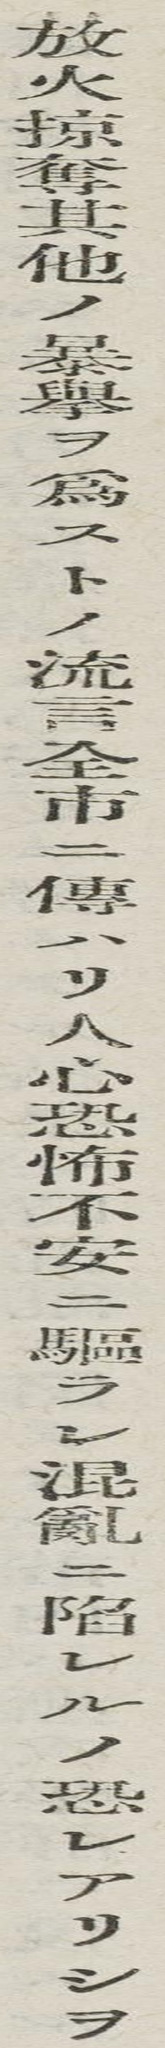放火掠奪其他ノ暴挙ヲ為ストノ流言全市ニ伝ハリ人心恐怖不安ニ駆ラレ混乱ニ陥レルノ恐レアリシヲ
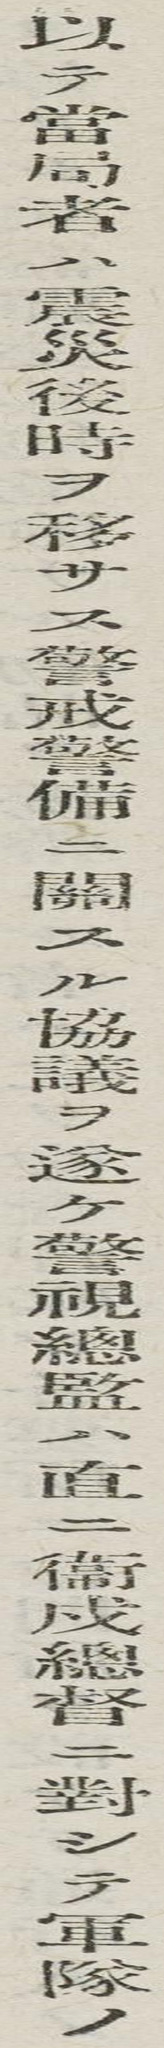以テ当局者ハ震災後時ヲ移サス警戒警備ニ関スル協議ヲ遂ケ警視総監ハ直ニ衛戍総督ニ対シテ軍隊ノ
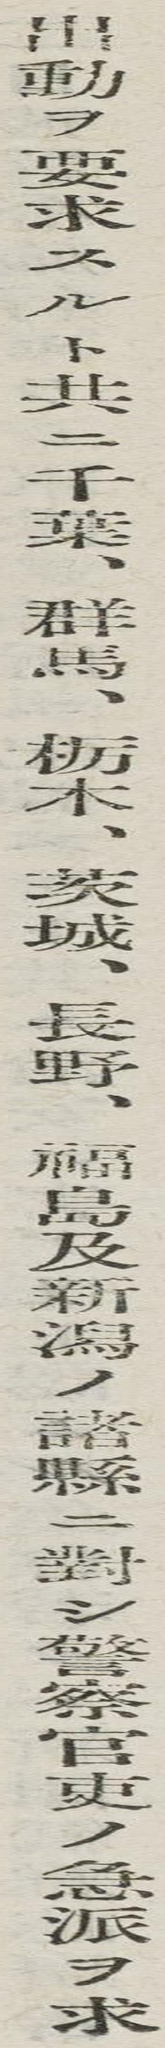出動ヲ要求スルト共ニ千葉、群馬、栃木、茨城、長野、福島及新潟ノ諸県ニ対シ警察官吏ノ急派ヲ求
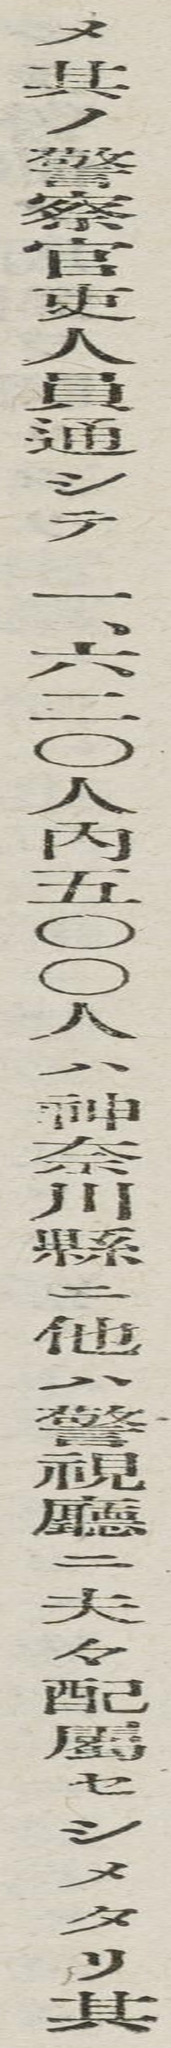メ其ノ警察官吏人員通シテ一、六二〇人内五〇〇人ハ神奈川県ニ他ハ警視庁ニ夫々配属セシメタリ其
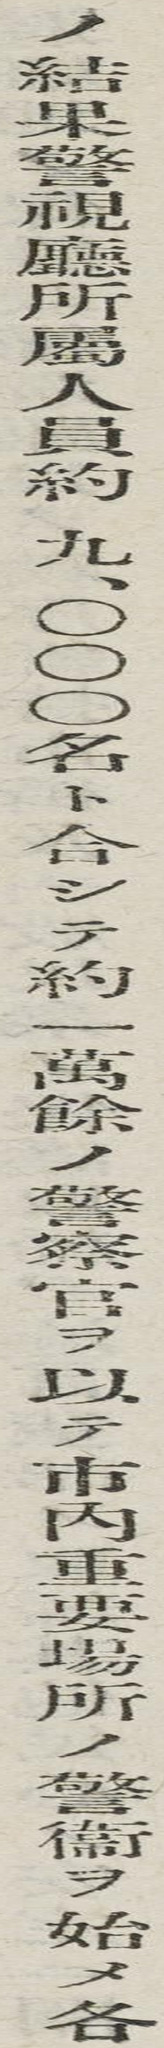ノ結果警視庁所属人員約九、〇〇〇名ト合シテ約一万余ノ警察官ヲ以テ市内重要場所ノ警衛ヲ始メ各

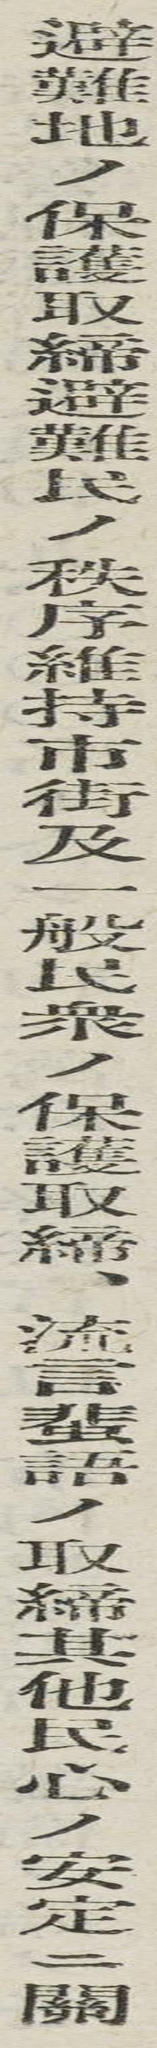避難地ノ保護取締避難民ノ秩序維持市街及一般民衆ノ保護取締、流言蜚語ノ取締其他民心ノ安定ニ関
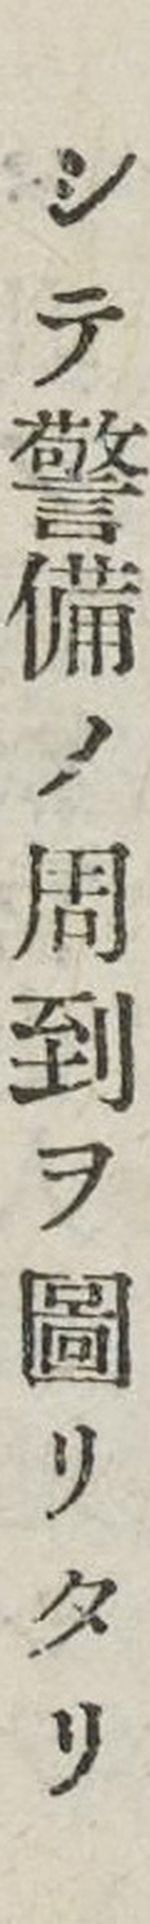シテ警備ノ周到ヲ図リタリ
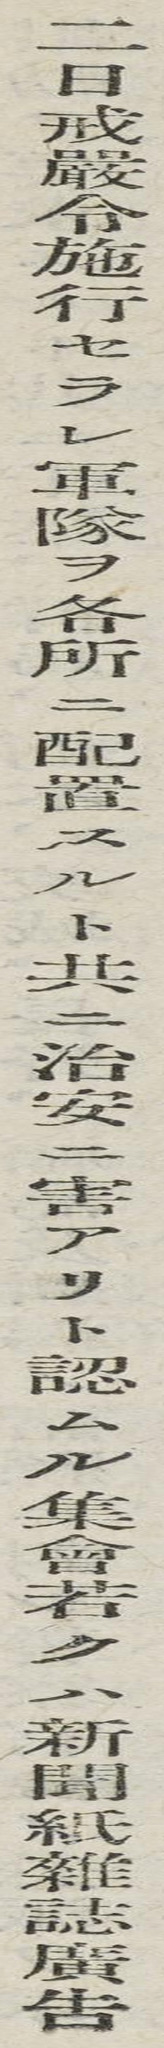二日戒厳令施行セラレ軍隊ヲ各所ニ配置スルト共ニ治安ニ害アリト認ムル集会若クハ新聞紙雑誌広告
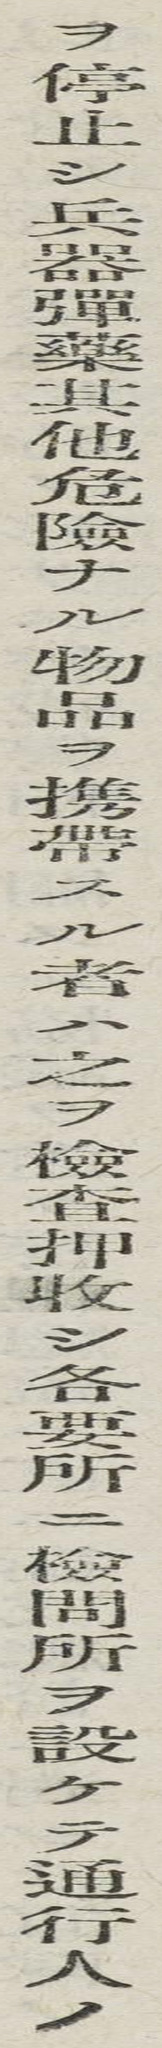ヲ停止シ兵器弾薬其他危険ナル物品ヲ携帯スル者ハ之ヲ検査押収シ各要所ニ検問所ヲ設ケテ通行人ノ
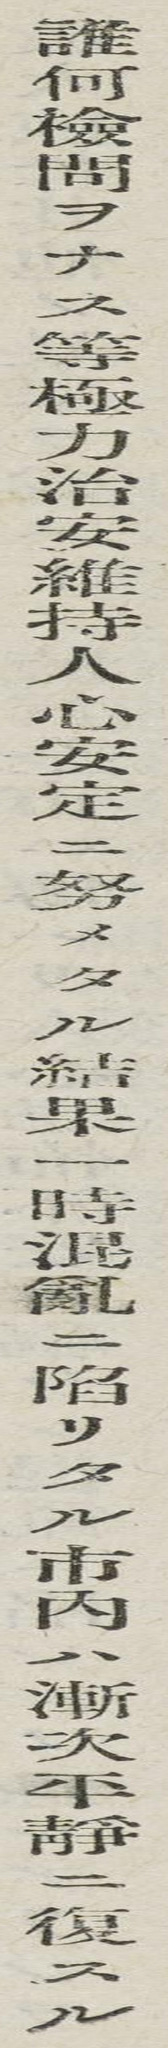誰何検問ヲナス等極力治安維持人心安定ニ努メタル結果一時混乱ニ陥リタル市内ハ漸次平静ニ復スル
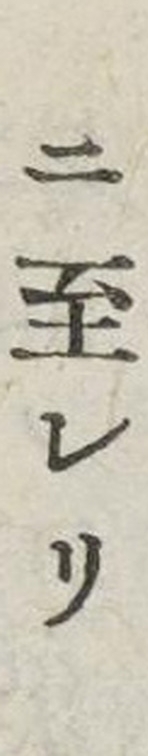ニ至レリ
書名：震災被害状況並救護施設概要
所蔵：東京大学地震研究所図書室 Earthquake Research Institute Library, The University of Tokyo, JAPAN
